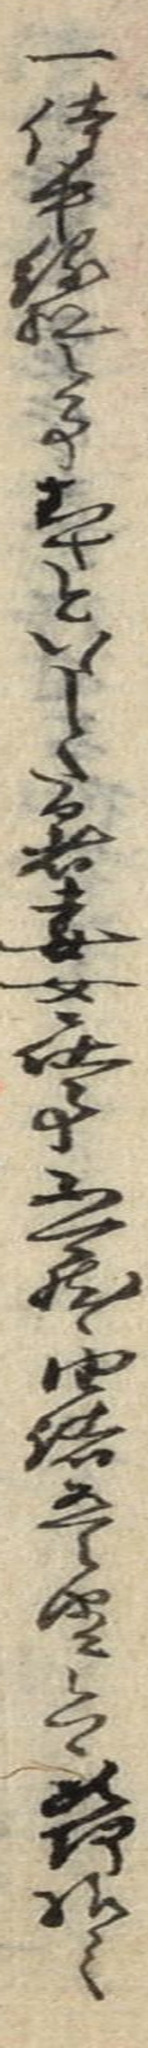一侍中縁組之事むさといたしたる者妻女ニ仕事不可然候由緒有之儀ニ候ハヽ如何様之
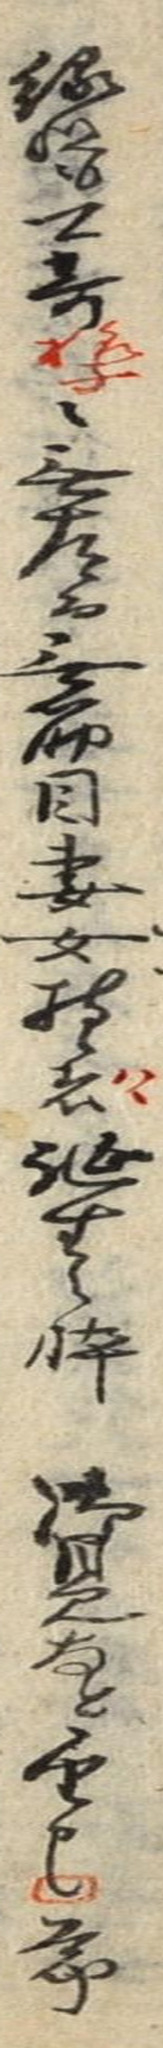縁組も可寄之無左ニ而無筋目妻女持候者誕生之倅御目見なと望申候節
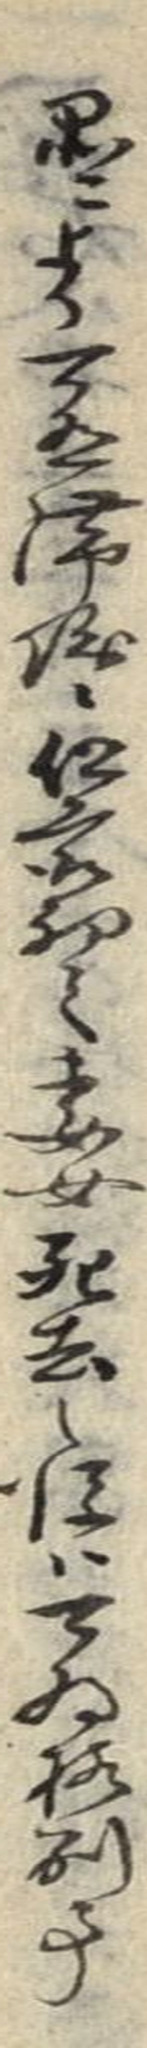品ニより可有滞儀ニ但最初之妻女死去之後ハ可為格別事
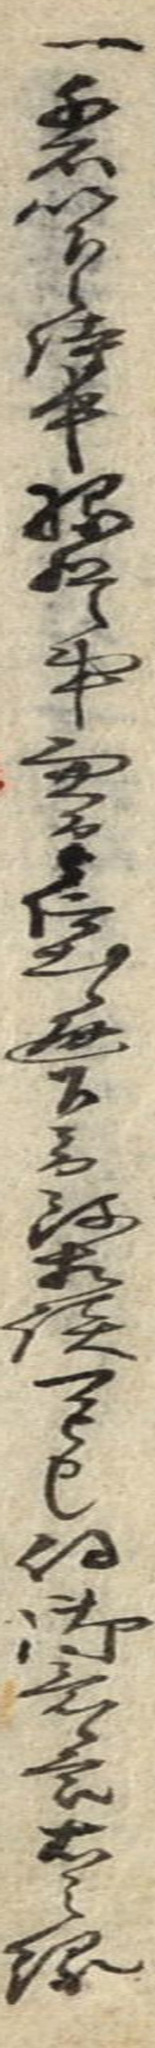一千石以下之侍中縁組之事兼而被仰出候通下ニ而致相談可被申候伺御意之節右之縁
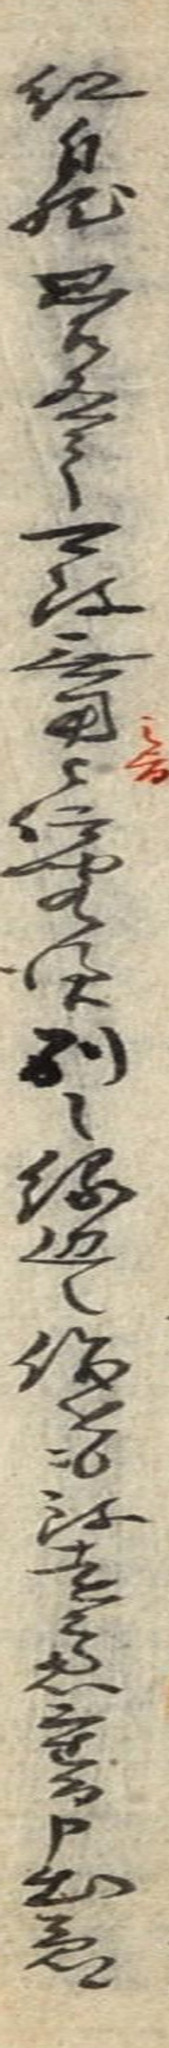組自然思召有之可致無用被仰聞候得ハ別之縁辺之儀をも致遠慮重而申出兼候
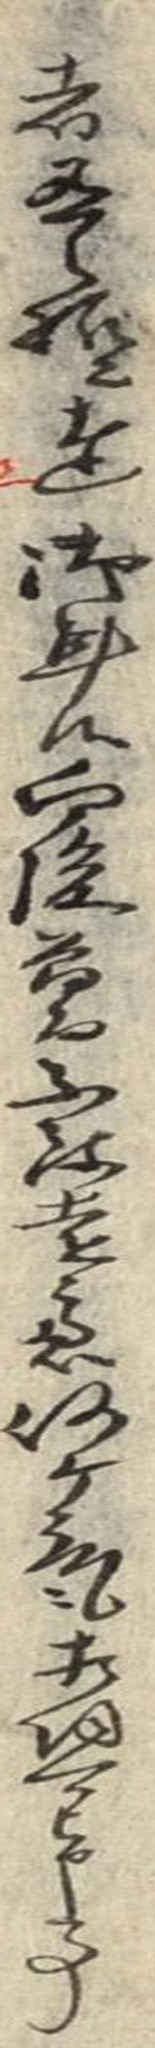者有之様ニ達御聞候向後曽而不致遠慮何ケ度も相伺可被申事
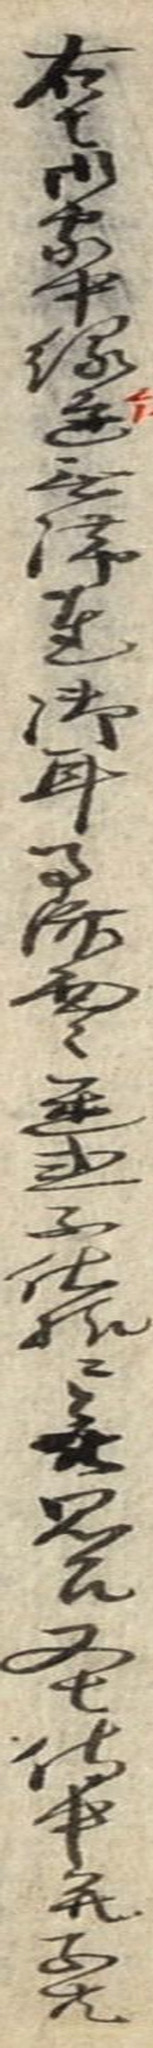右者御家中縁迹無滞達御耳事済面々迷惑不仕様ニと被思召又者侍中并子共
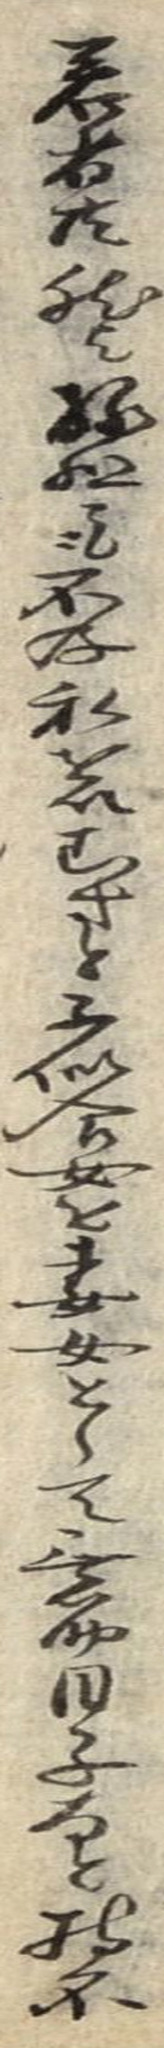若者共然与縁組ニも不及私を以むさと不似合女を妻女として無筋目子なと持不
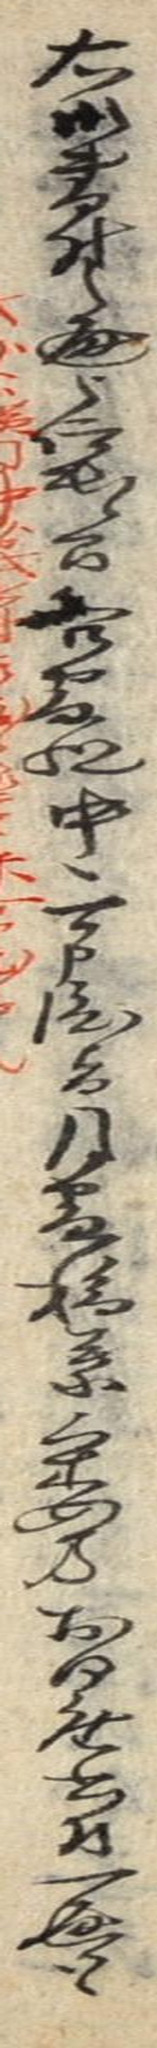右御書付之通被仰出候間各番組中へ可申渡旨月番稲葉采女方於同座書付一通ツヽ
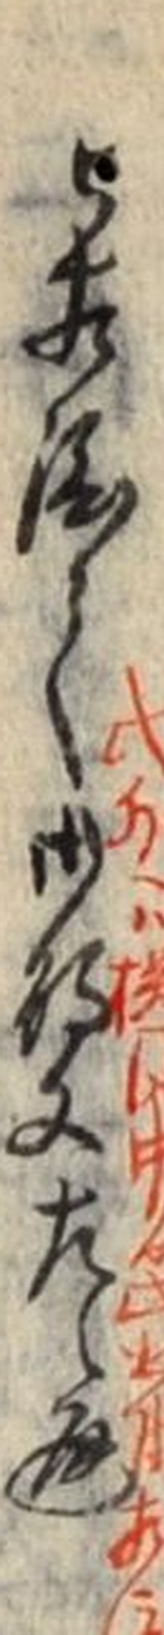被相渡之御触文左之通

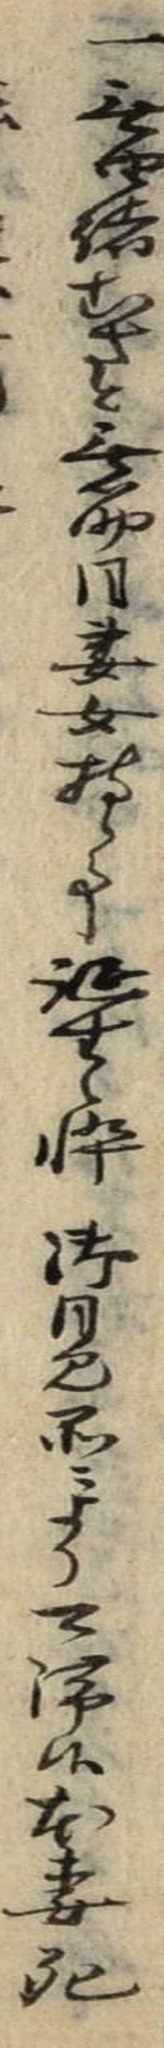一無由緒むさと無筋目妻女持候事誕生之悴御目見品により可滞候本妻死
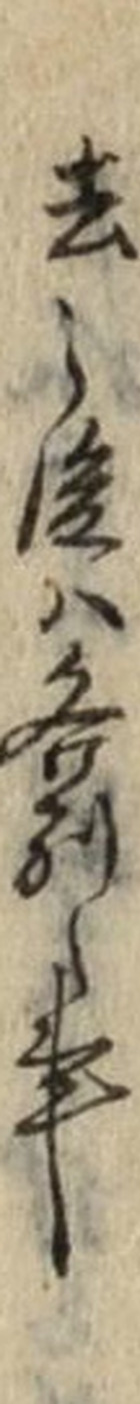去之後は格別之事
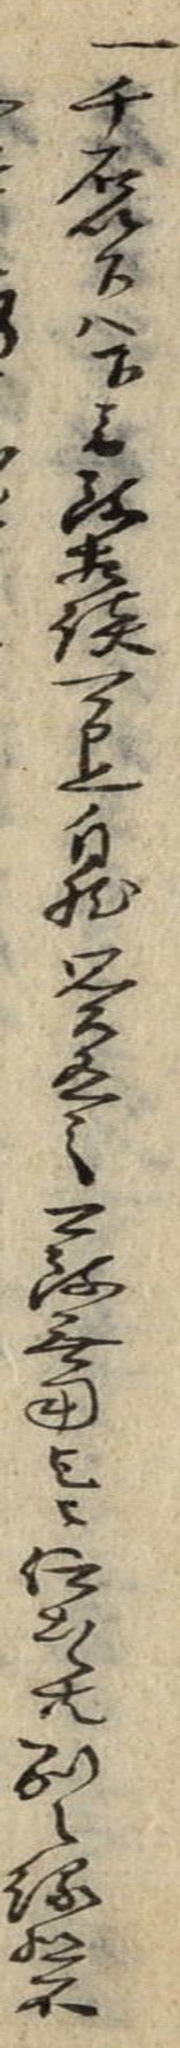一千石以下は下に而致相談可申上自然思召有之可致無用と被仰出候共別之縁組不
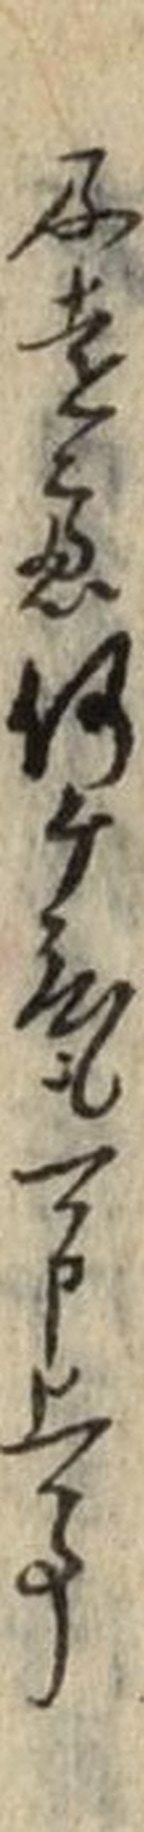及遠慮何ヶ度も可申上事
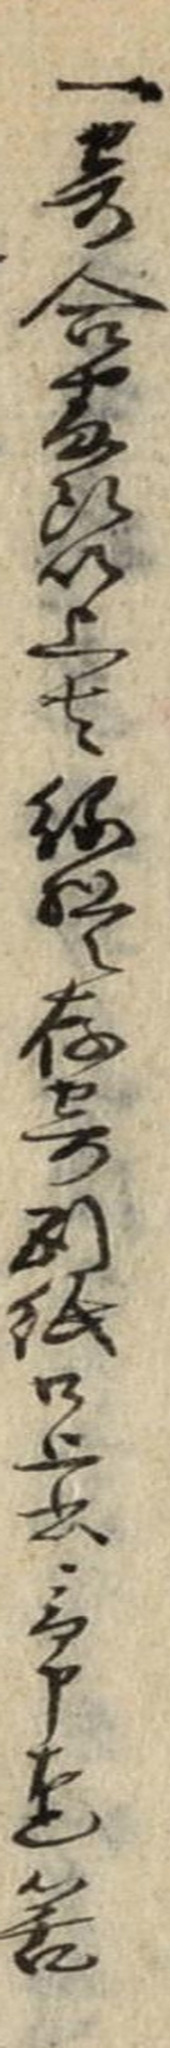一寄合番頭以上は縁組之存寄別紙口上書に而申達筈
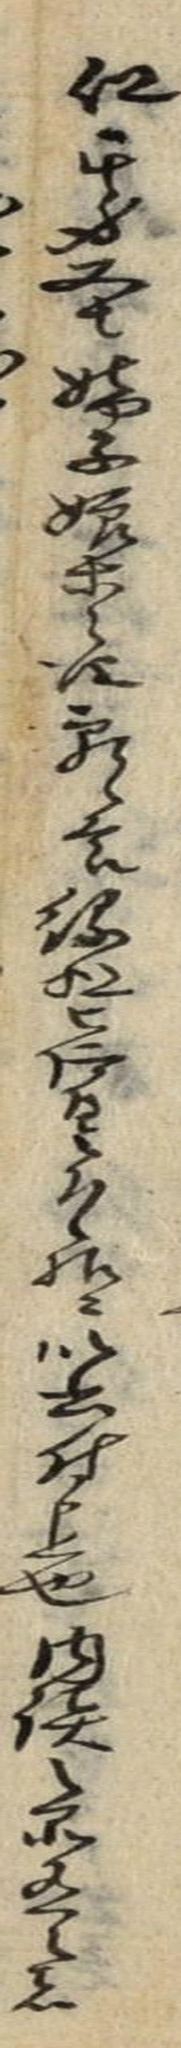但其身又は嫡子娘等之儀願候節縁組被仰付被下候様に御書付申上也内談之品有之は
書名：養子縁組之部
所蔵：福井県文書館 Fukui Prefectural Archives
